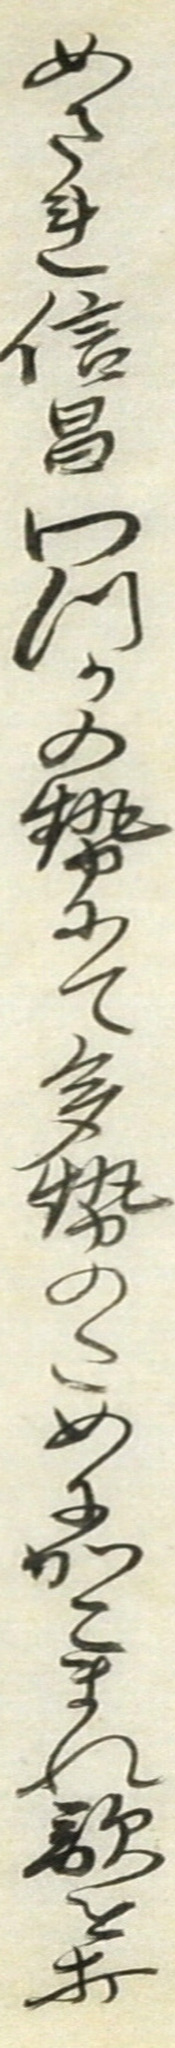めされ信昌わつかの勢にて多勢のためにかこまれ敵を打
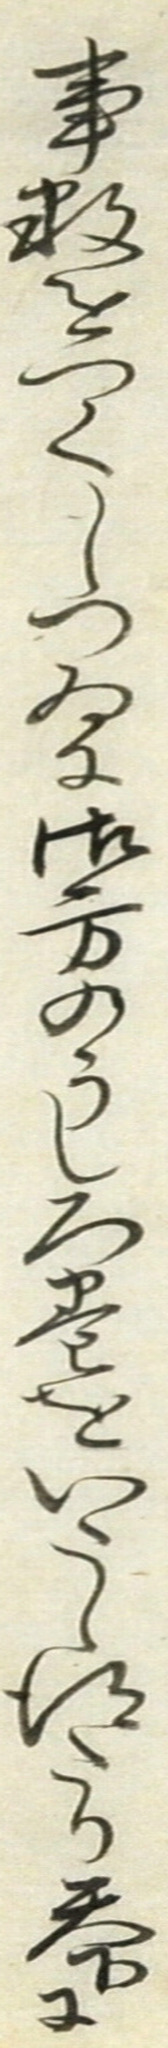事数をつくしつゐに御方のうしろ巻をいたし得たり天下に
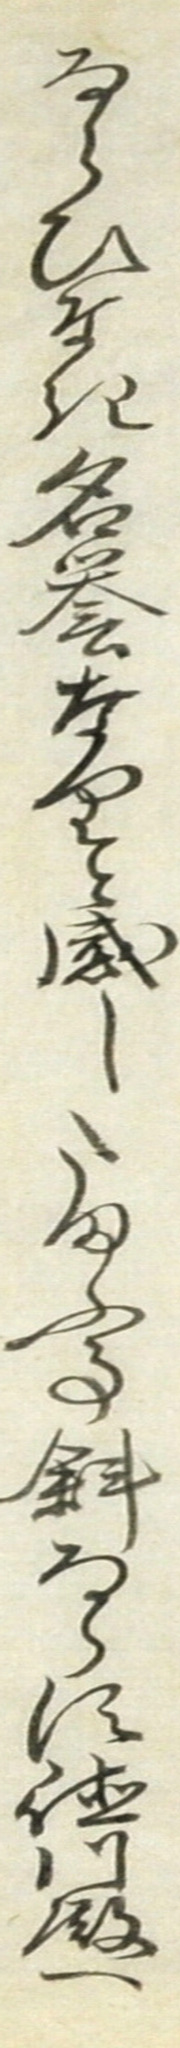ならひなき名誉なりと感したまふ事斜ならす徳川殿へ
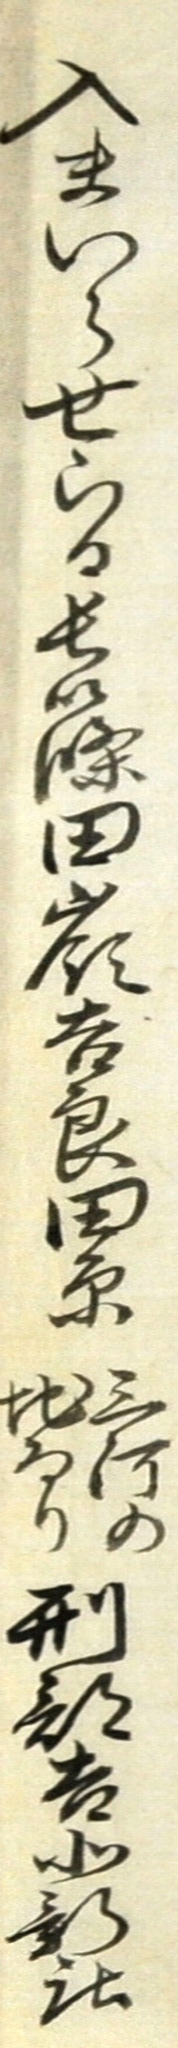入まいらせらる長篠田嶺吉良田原三河の地なり刑部吉北新庄

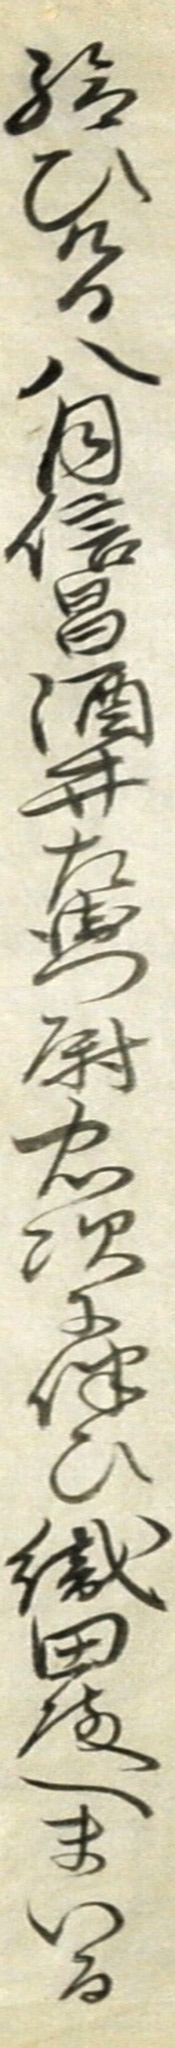給ひける八月信昌酒井左衛門尉忠次に伴ひ織田殿へまいる
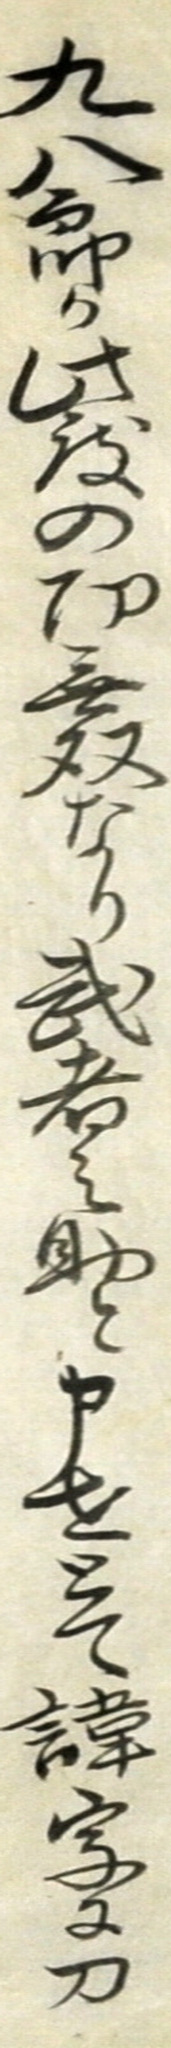九八郎か此度の功無双なり武者之助と申せとて諱字に刀
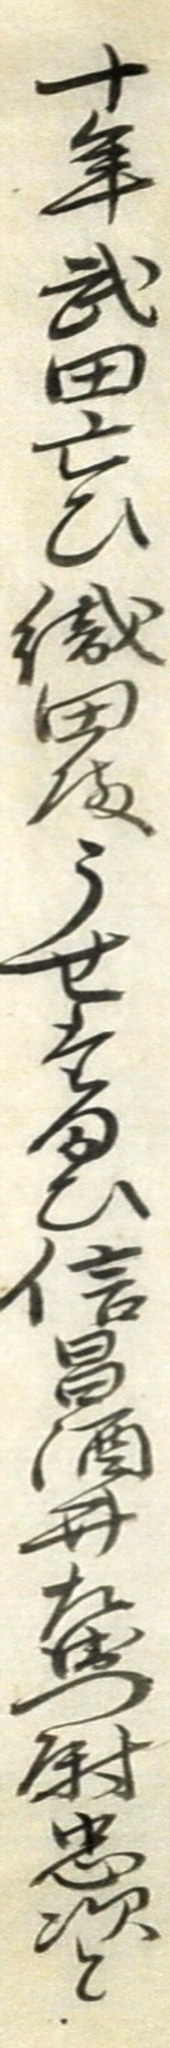十年武田亡ひ織田殿うせたまひ信昌酒井左衛門尉忠次と
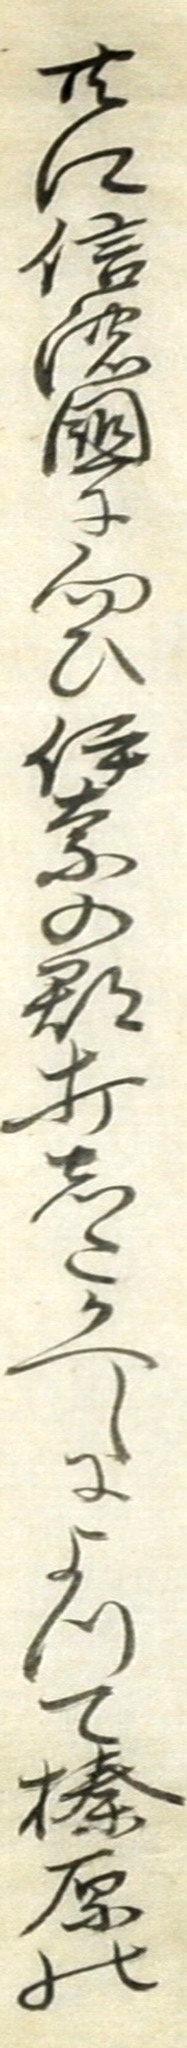共に信濃国に向ひ伊奈の郡打したかへしによつて榛原の
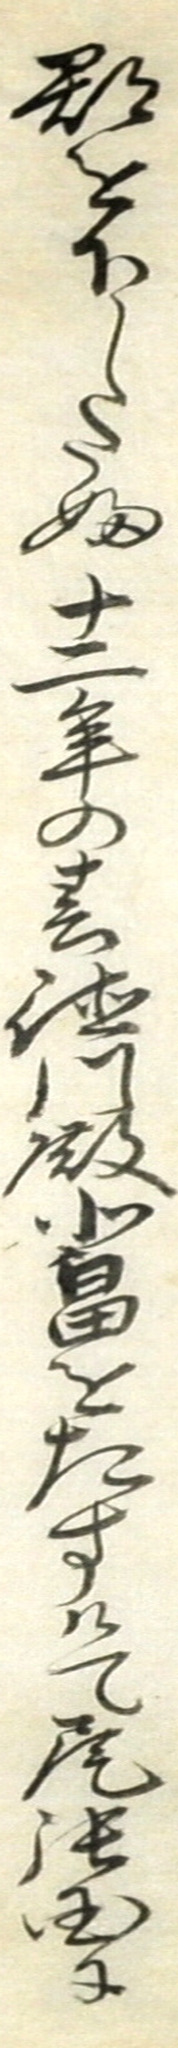郡を下したふ十二年の春徳川殿北畠をたすけて尾張国に
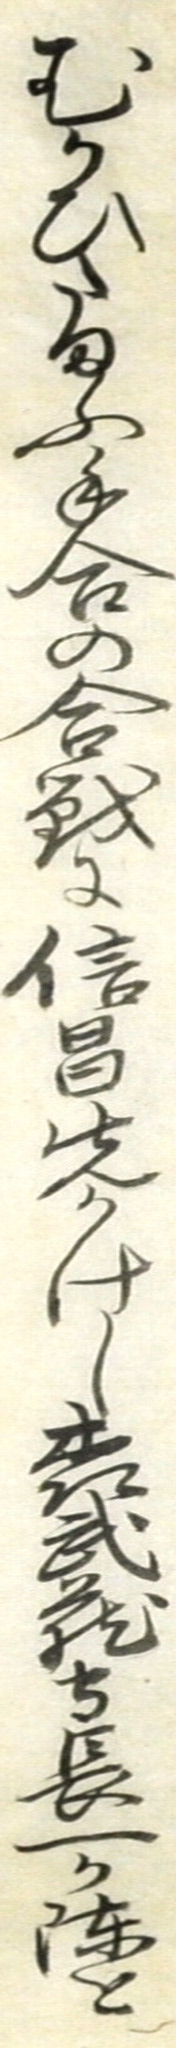むかひたまふ手合の合戦に信昌先かけし森武蔵守長一か陣を
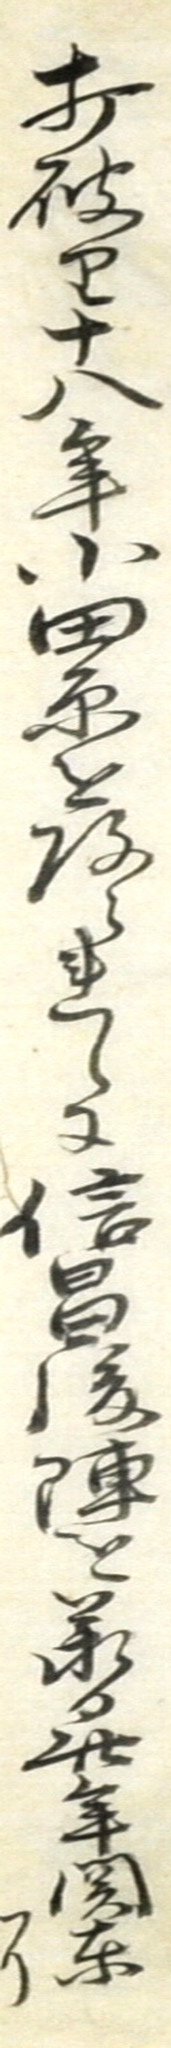打破り十八年小田原を攻られしに信昌後陣を承る此年関東に
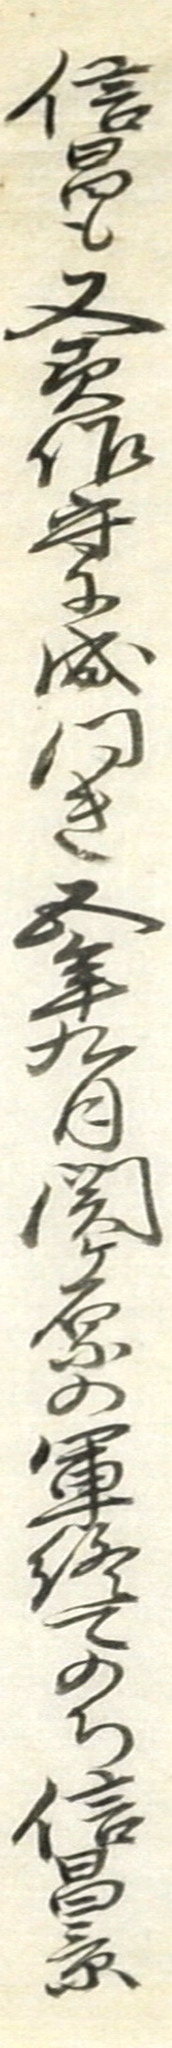信昌も又美作守に成同き五年九月関ヶ原の軍終てのち信昌京

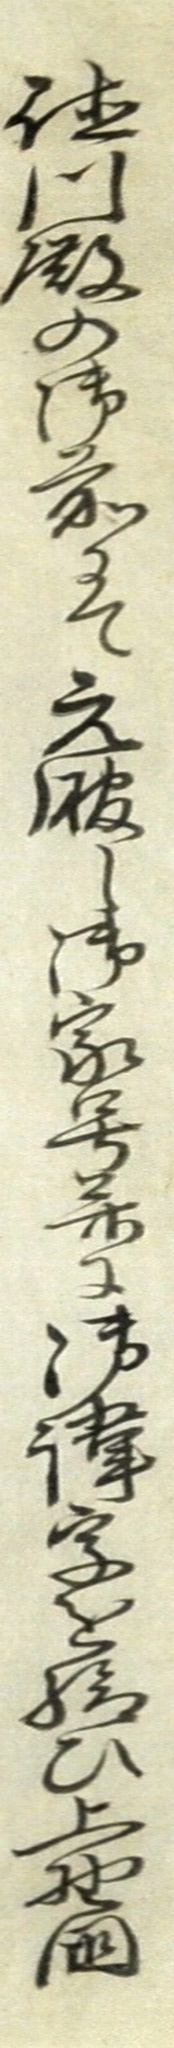徳川殿の御前にて元服し御家号前に御諱字を給ひ上野国
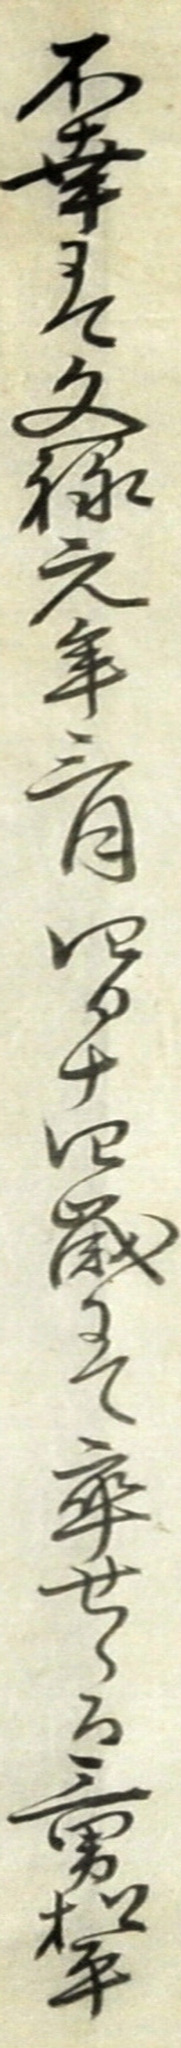不幸にて文禄元年三月四日十四歳にて卒せらる三男松平
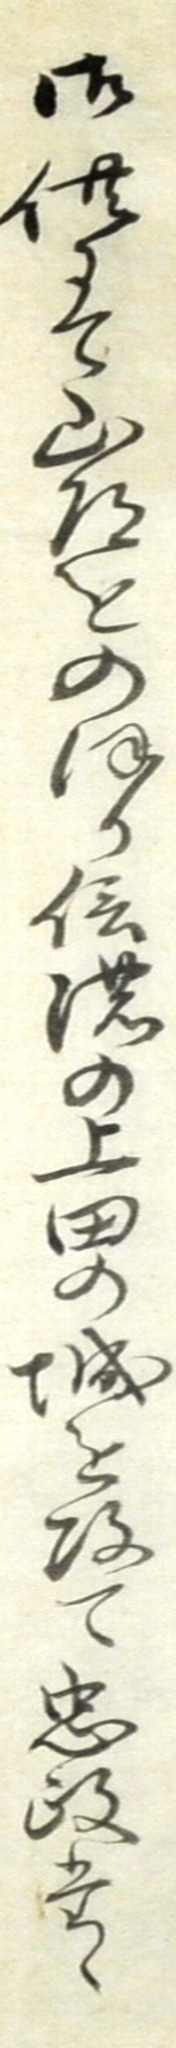御供にて山道をのほり信濃の上田の城を攻て忠政たゝ
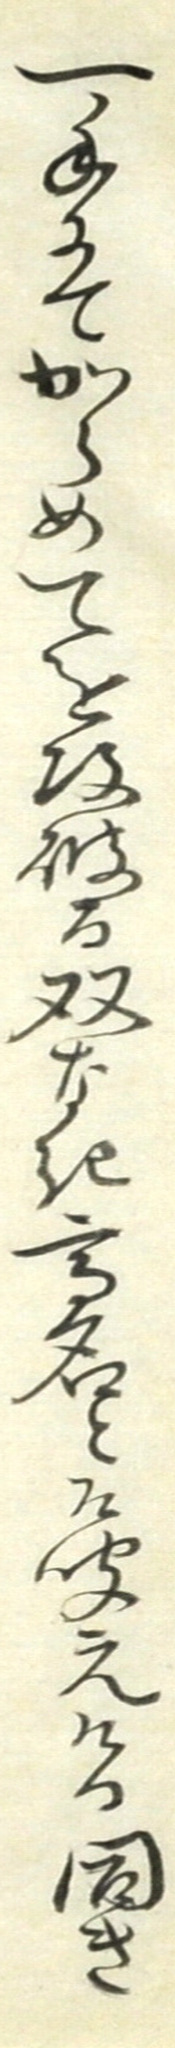一手にてからめてを攻破る双なき高名とそ聞えける同き
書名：藩翰譜（六）
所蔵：伊那市立高遠町図書館・合同会社AMANE
